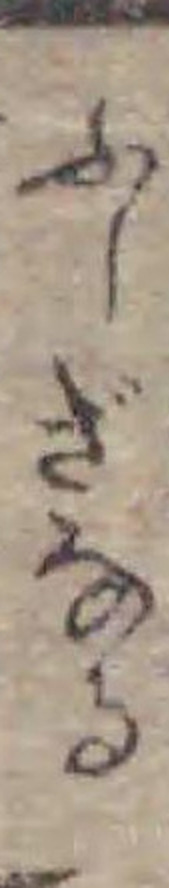ふしぎなる
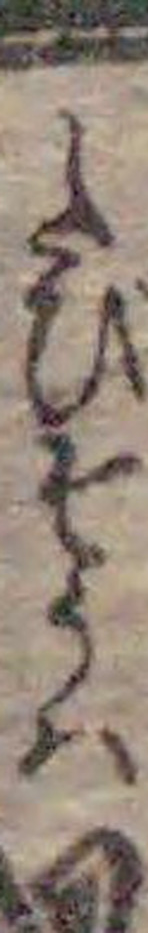たびそうは
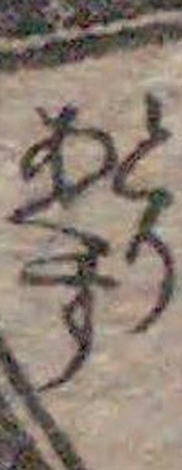あへす
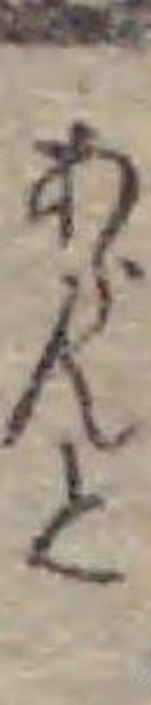あらんと
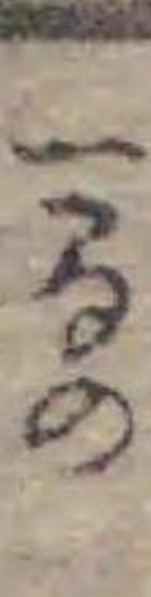一間の
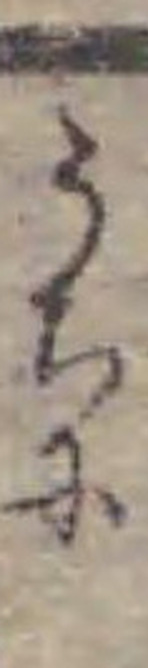うちに
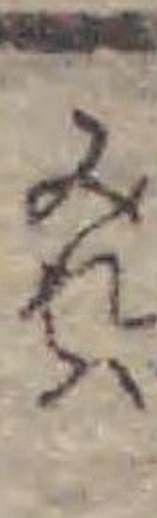みれば
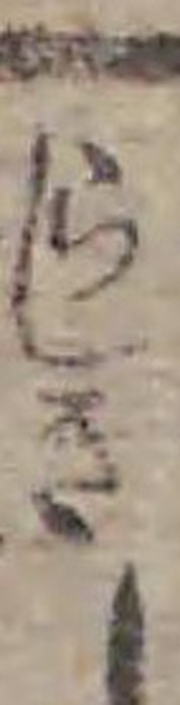らしき
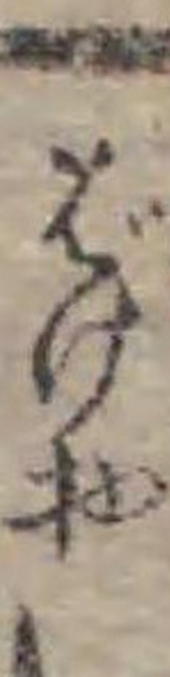ばけ物
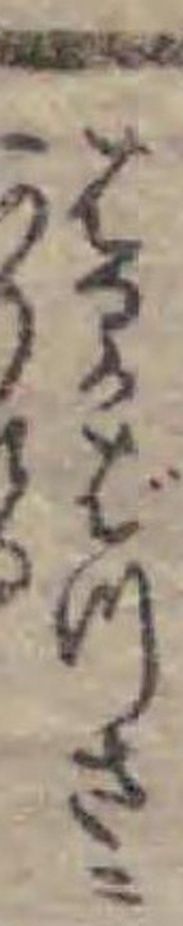ありける
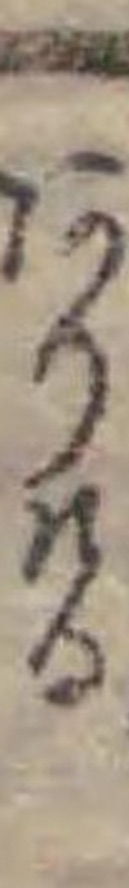ありける
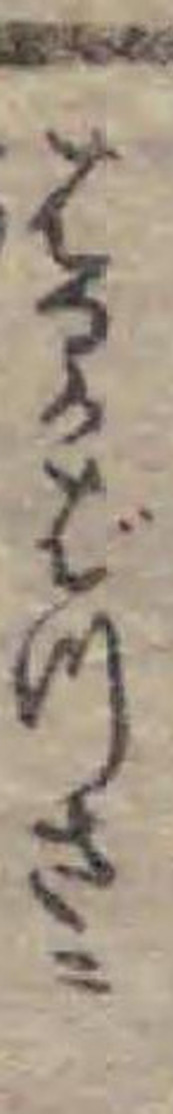はるかばつさに
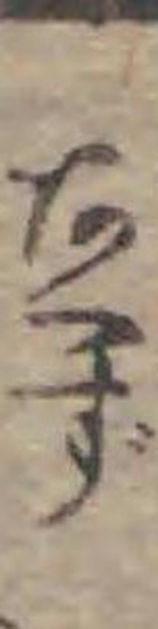あへず
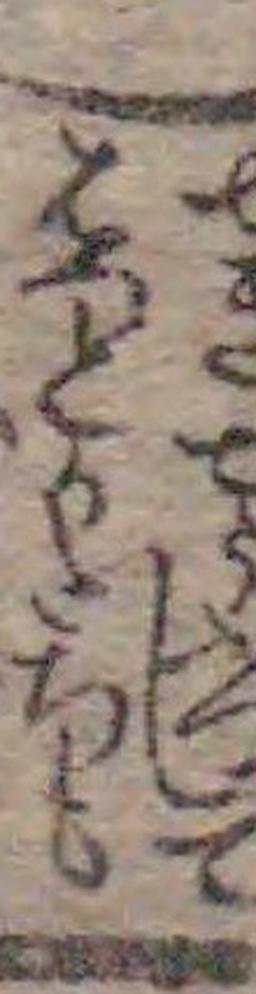はつとかたちも
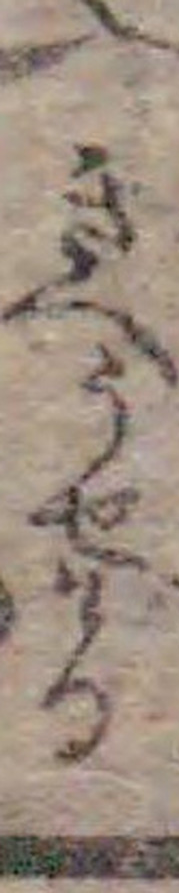きへうせける

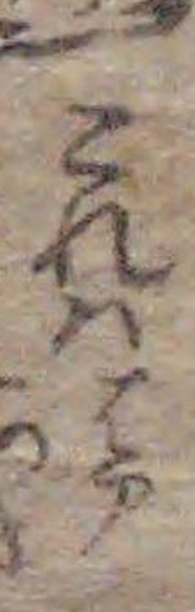これははァ
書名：歌の化物一寺再興 : 2巻
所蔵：国立国会図書館 National Diet Library, JAPAN
